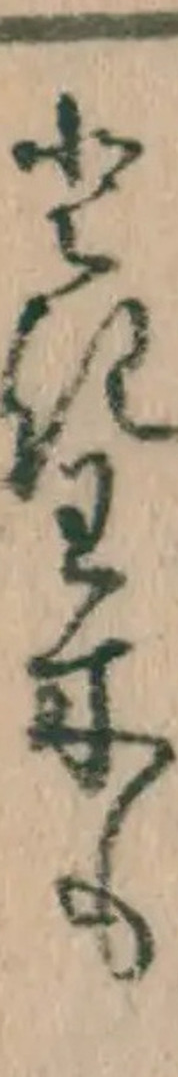ときわ木も

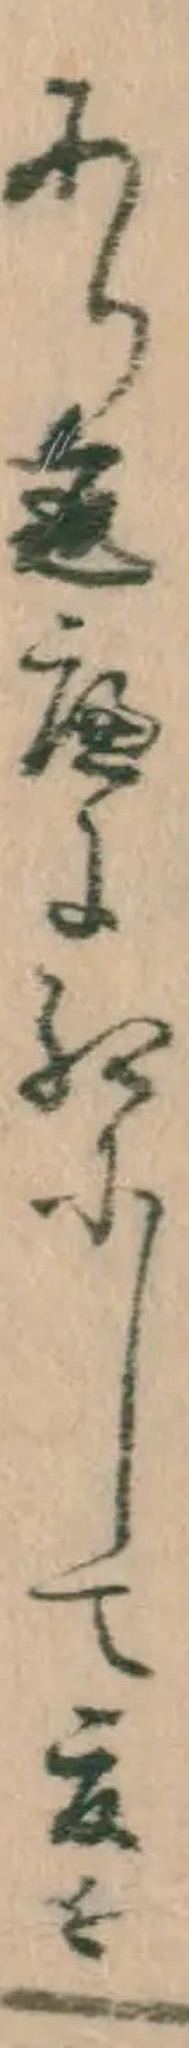あり色へに紅にして夏は
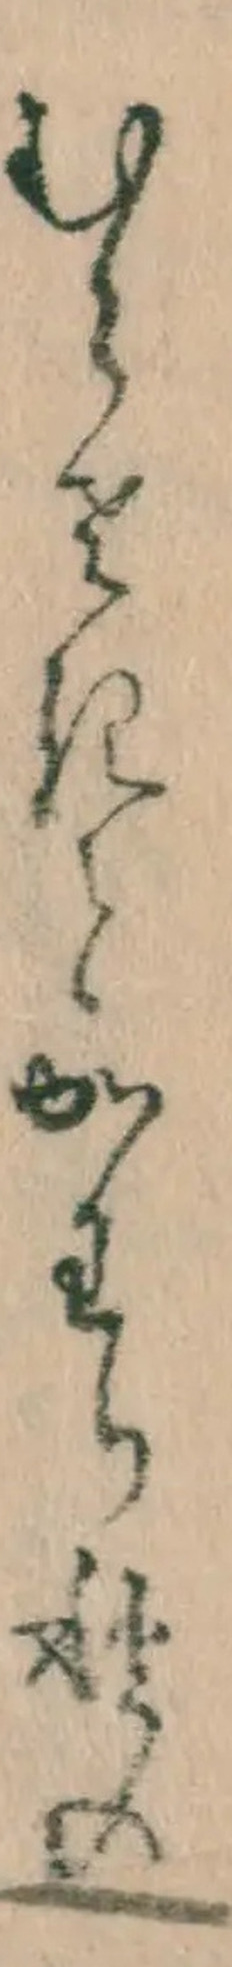むらさきとかわり秋の
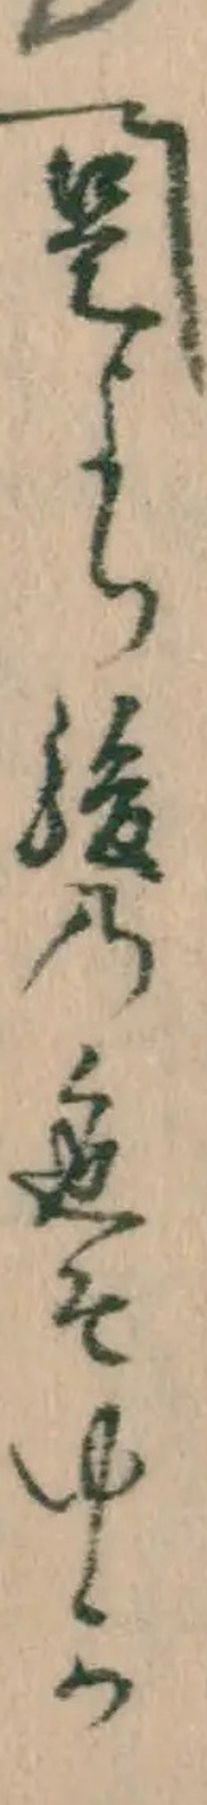〽是より後の色そゆか
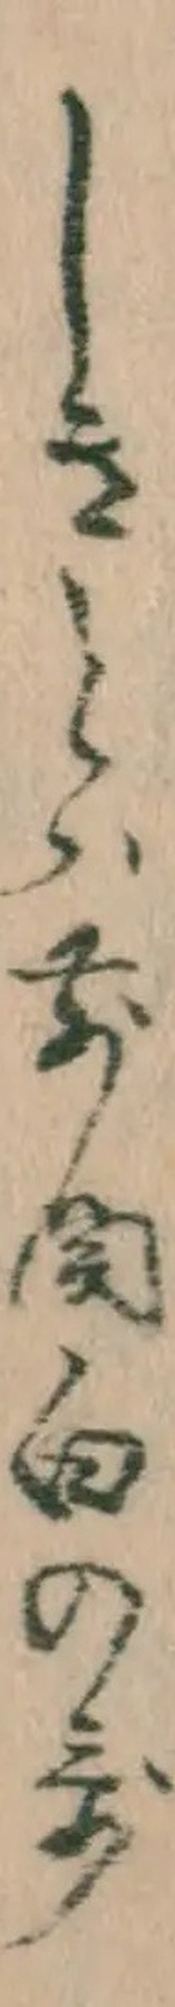しきとは前関白の哥
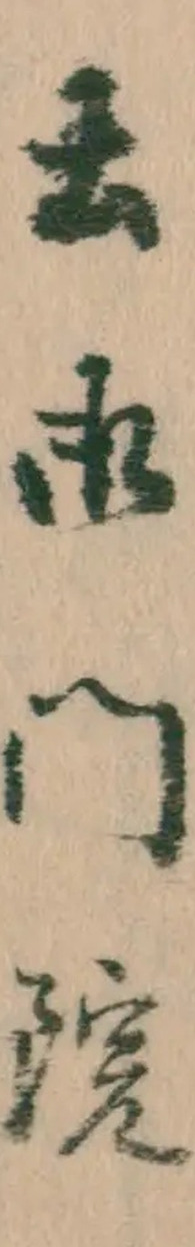土御門院
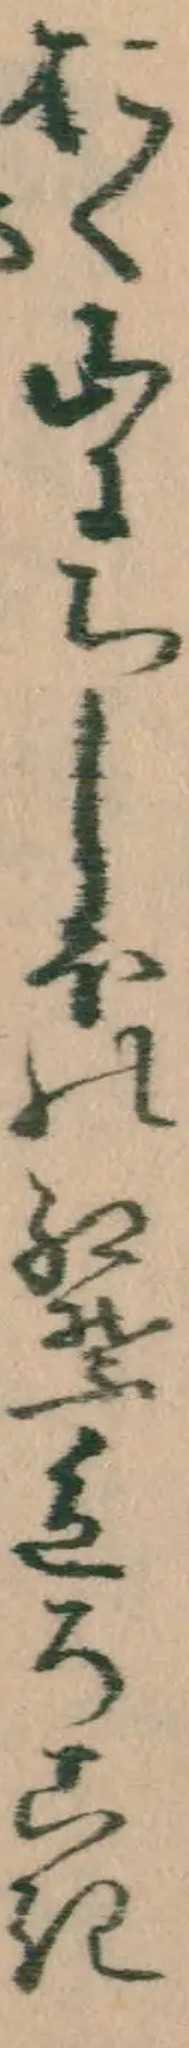おく山にちしほの紅葉色そこき
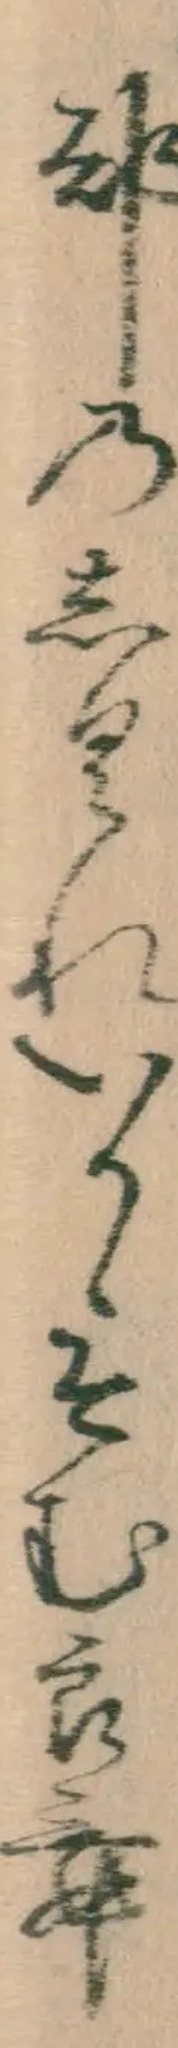都のしくれいかゝそむらむ
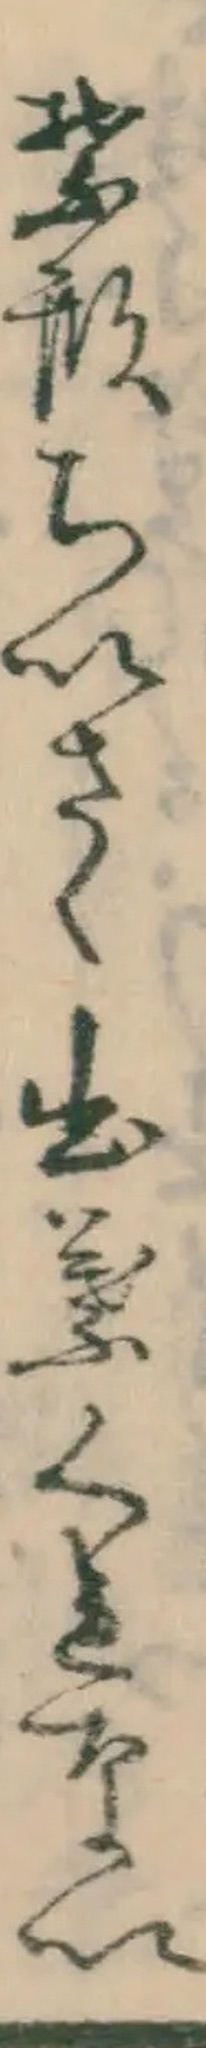葉形ちいさく出葉くれない
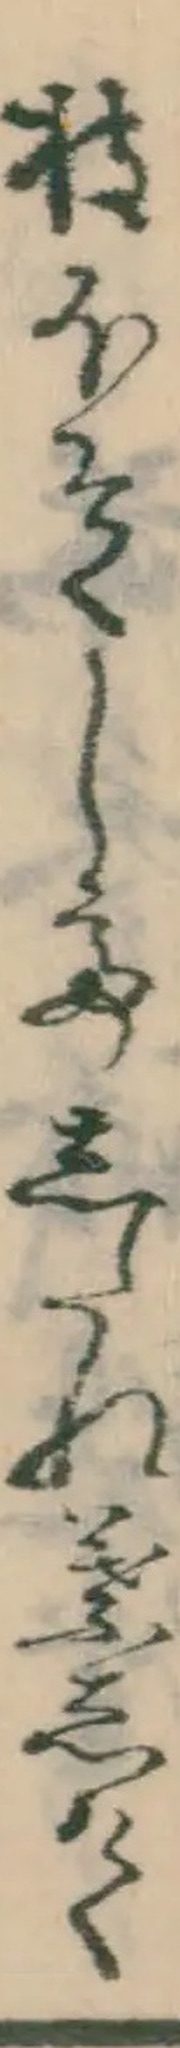枝ほそくしてしたれ葉しけく
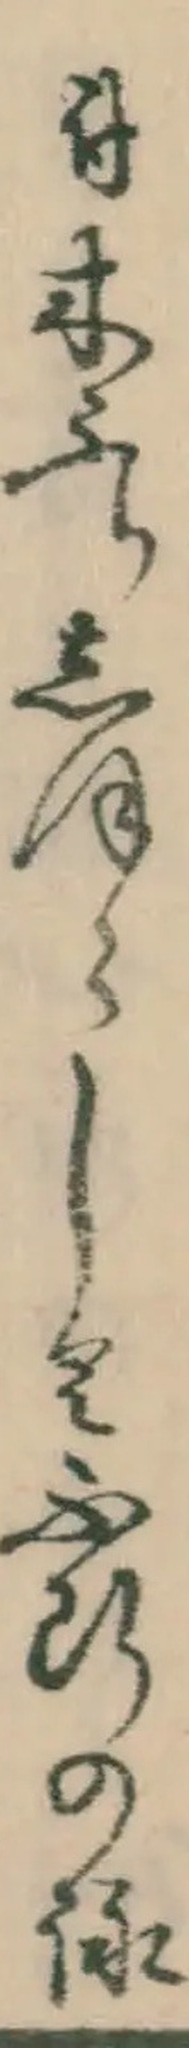付木ふりしほらしく不断の詠
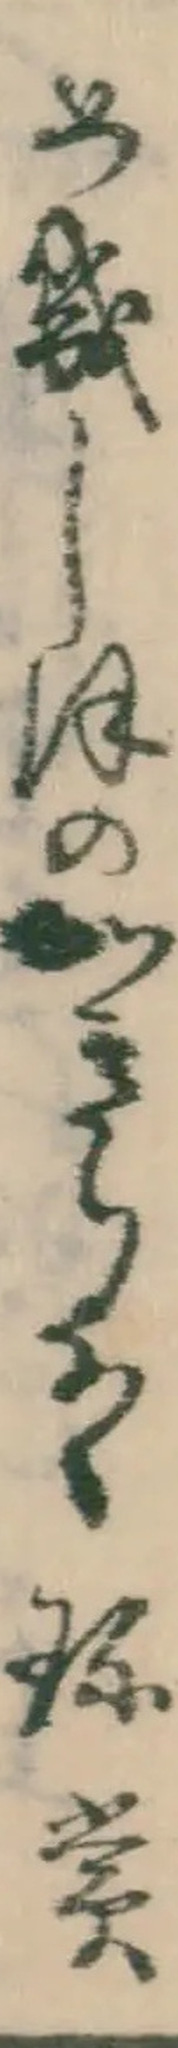め幾しほのかきりなく珍賞
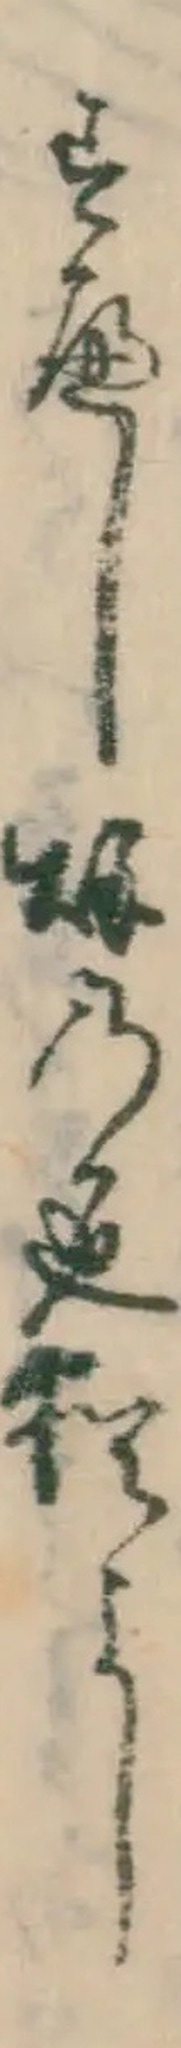すへし秋の色猶よし
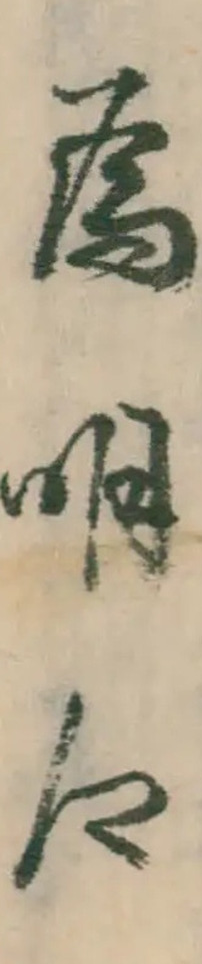為明卿
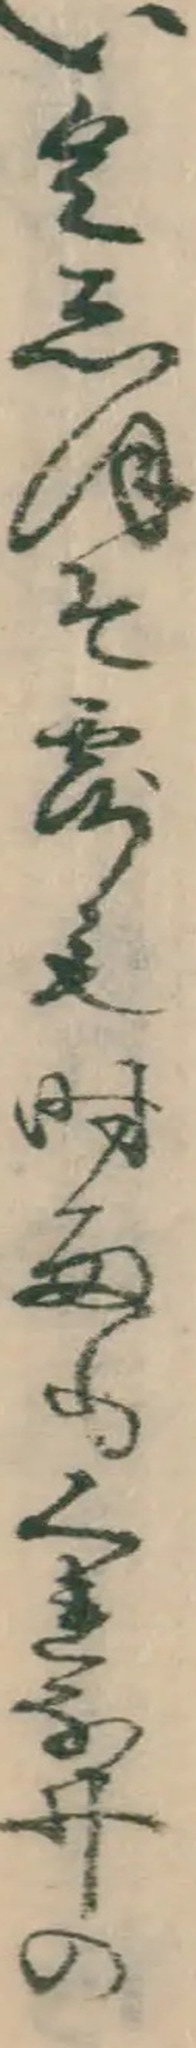いくしほそ露も時雨もくれなゐの
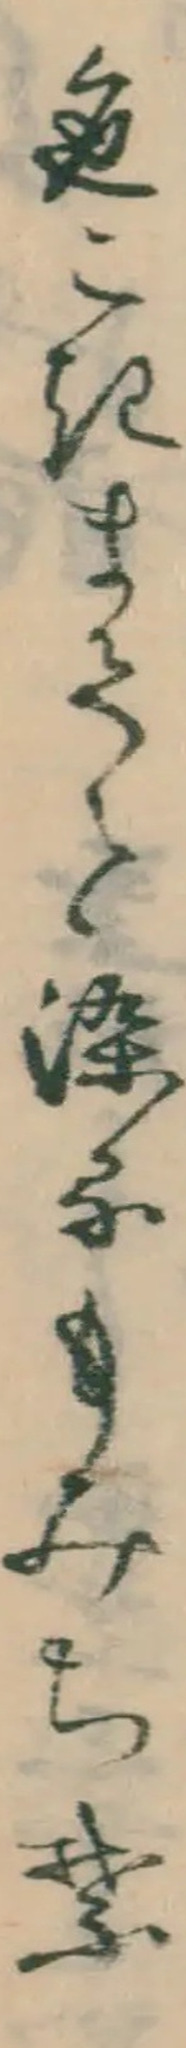色こきまてと染るもみち葉
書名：紅葉集
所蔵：国立国会図書館 National Diet Library, JAPAN
